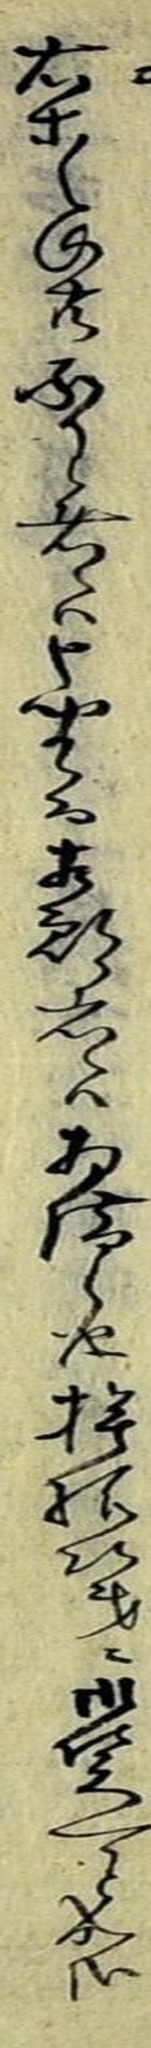右等之趣共承候者へは申聞候而相願候者へは拝借之儀模様次第に御貸可被成哉
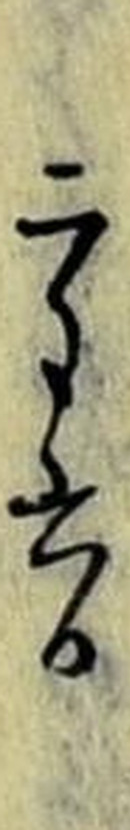二月六日
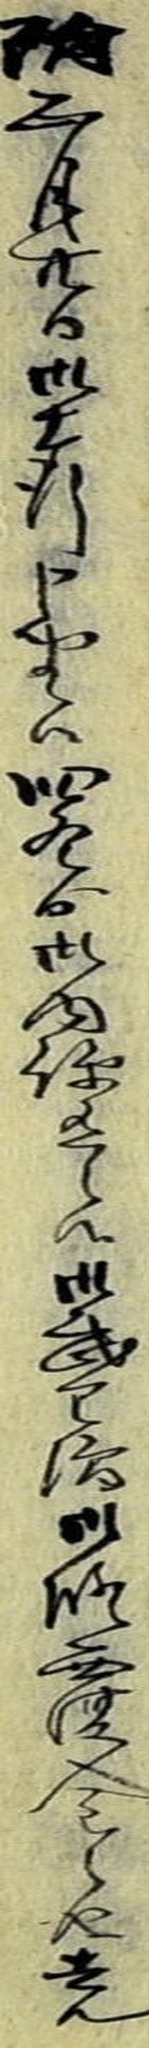附正月廿日御奉行申聞候は旧冬ゟ御内評有之候御武具傷御修覆金之儀去ル
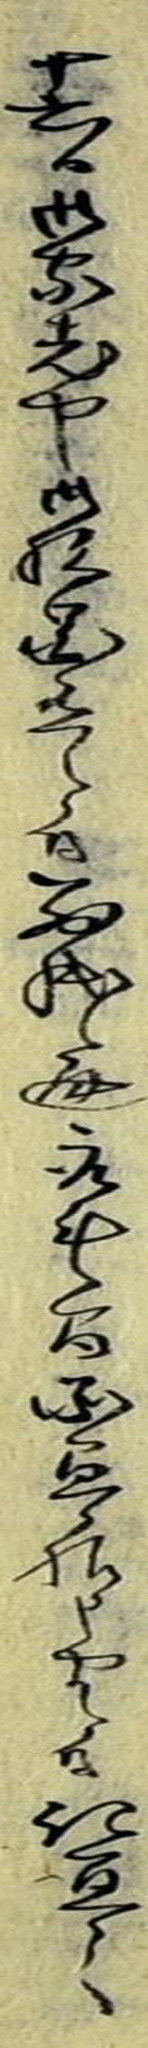十六日御家老中御指図有之候付別紙之通取斗候間承置候様申聞候に付記置之
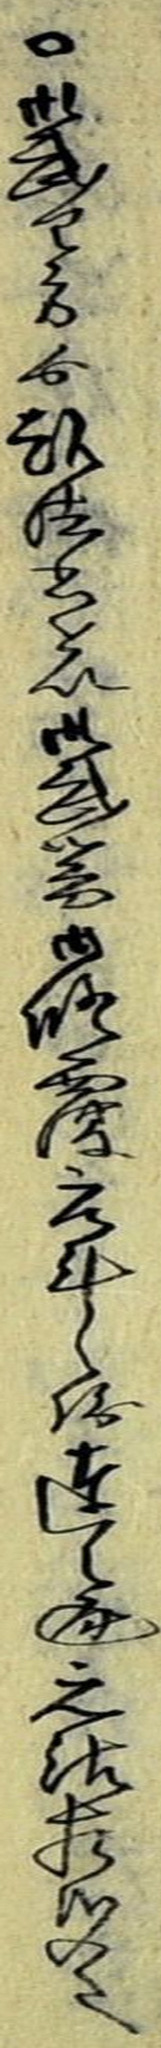○御武具方ゟ趣法書を以御武器御修覆取斗之儀達之通元銀拾弐メ匁

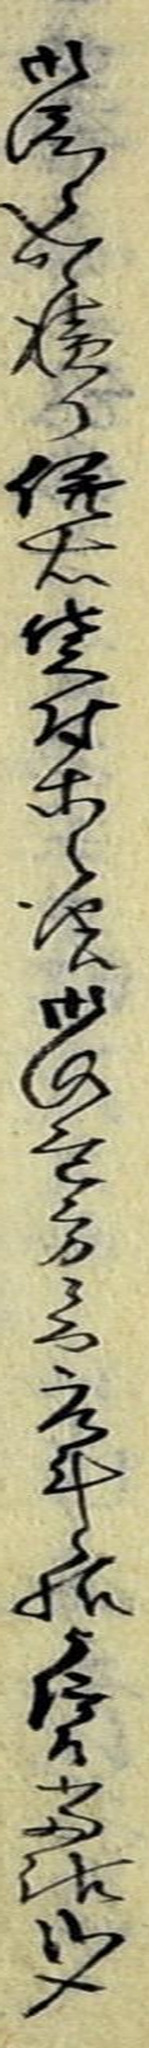御渡被成積り併右貸付等之儀は御趣意方に而取斗候様被仰付当銀弐貫
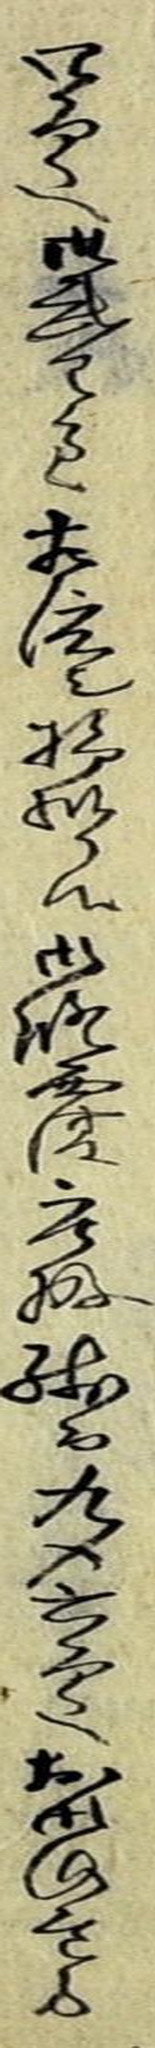四百匁御武具方へ相渡し指掛り候御修覆取扱残而九貫六百匁於御趣意方
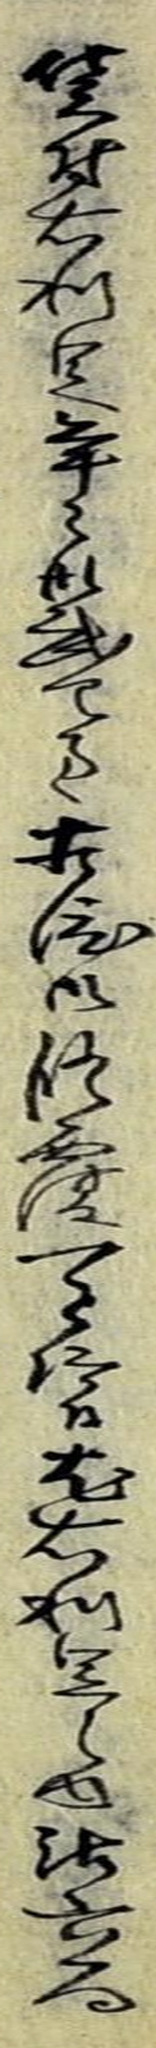貸付右利息年々御武具方へ相渡御修覆可被仰付尤右利息之内銀六百
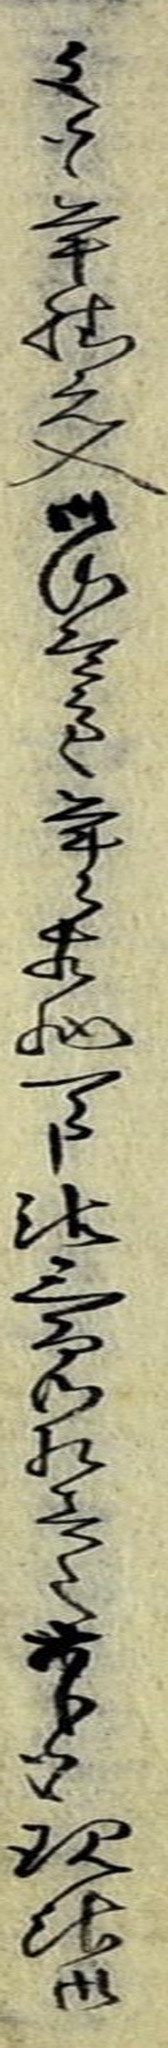匁つヽ年賦元入御趣意方へ年々相納可申銀三百弐拾壱匁六分つヽ現銀御
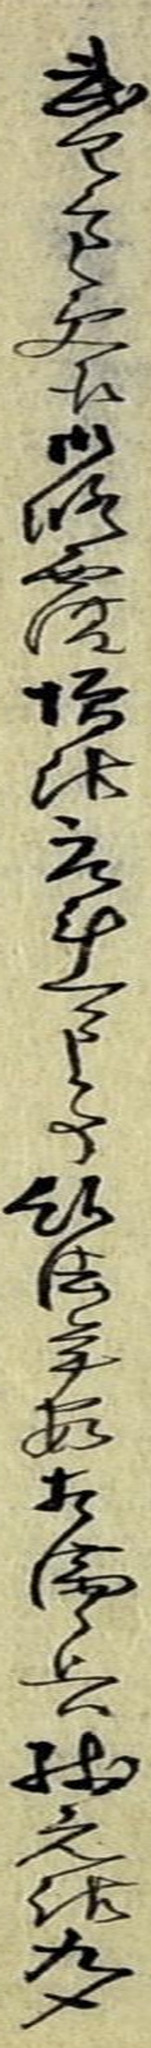武具方へ受取御修覆増銀取斗可申事趣法年数相満候上は残元銀九貫
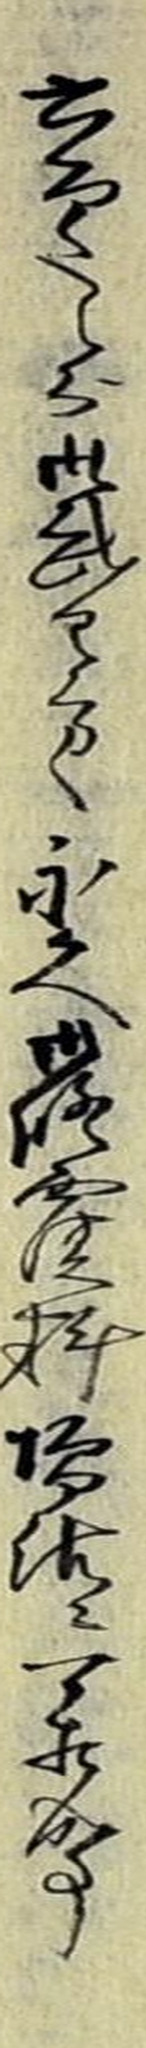六百匁之分御武具方へ永久御修覆料増銀に可相成事
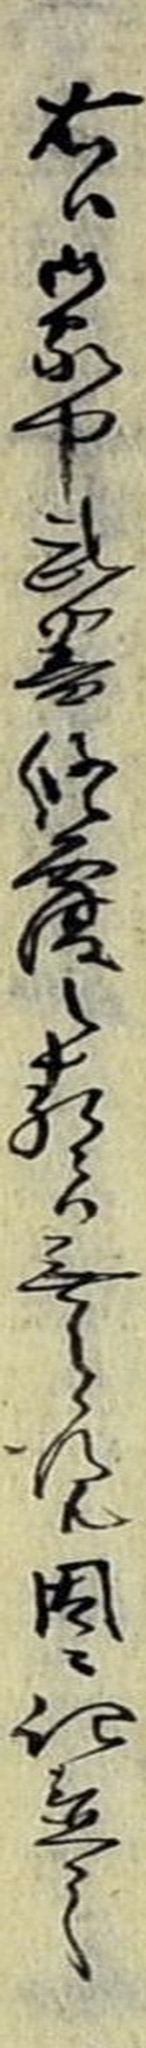右は御家中武器修覆之類には無之候得共因に記置之
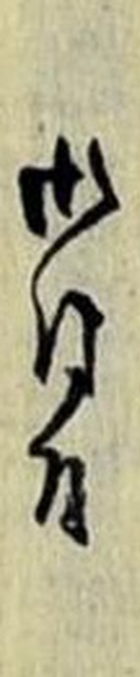御目付
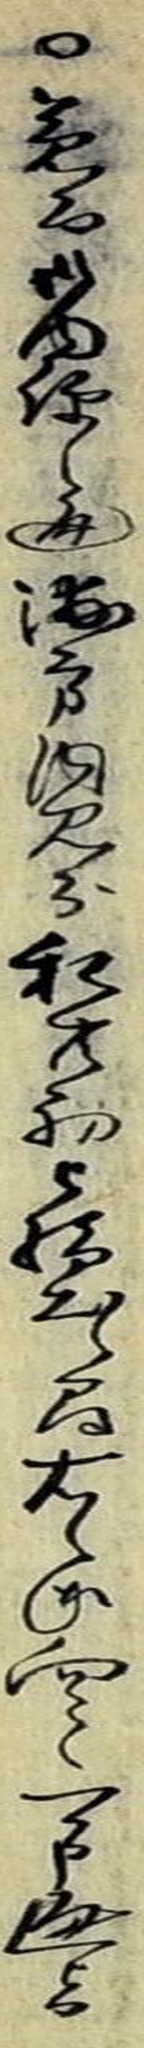○兼而御内評之通浦方内見分私共初指出候間右之趣向々へ可申通旨
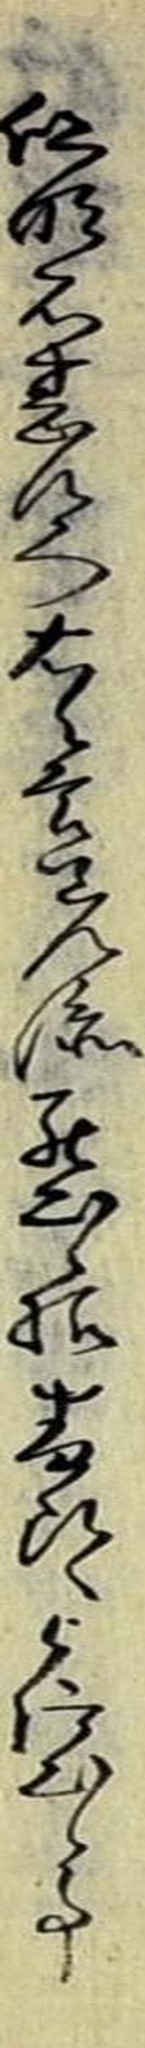但明石甚左衛門右之節差添罷出候様番頭へ被仰出候事
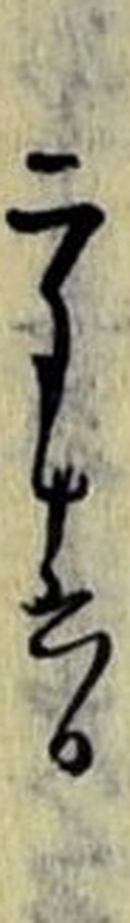二月十六日
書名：命令之部 四
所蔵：福井県文書館 Fukui Prefectural Archives
